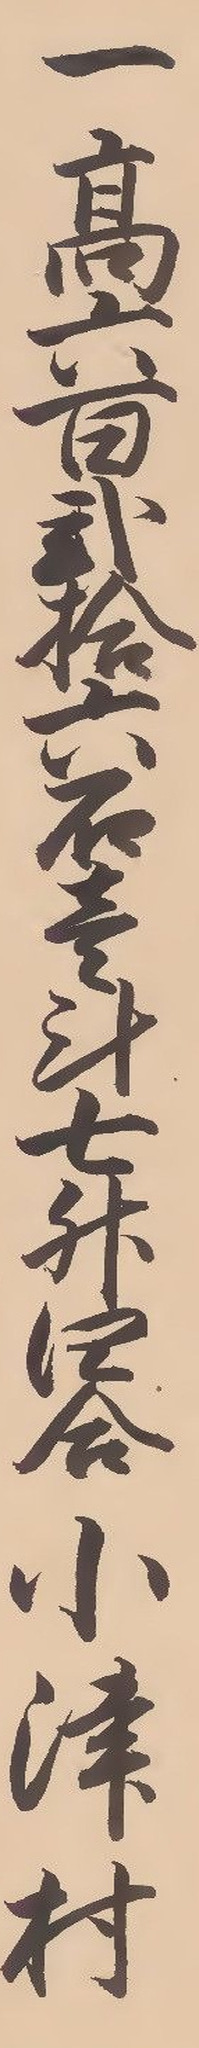一髙六百弐拾六石壱斗七升四合小津村
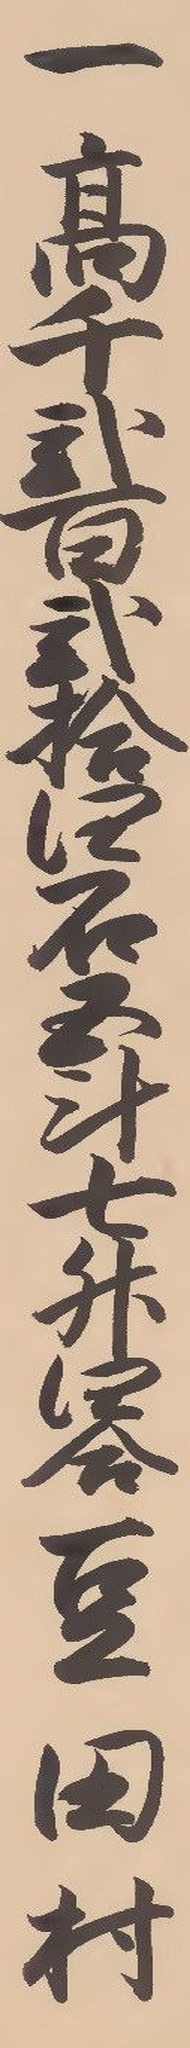一髙千弐百弐拾四石五斗七升四合豆田村
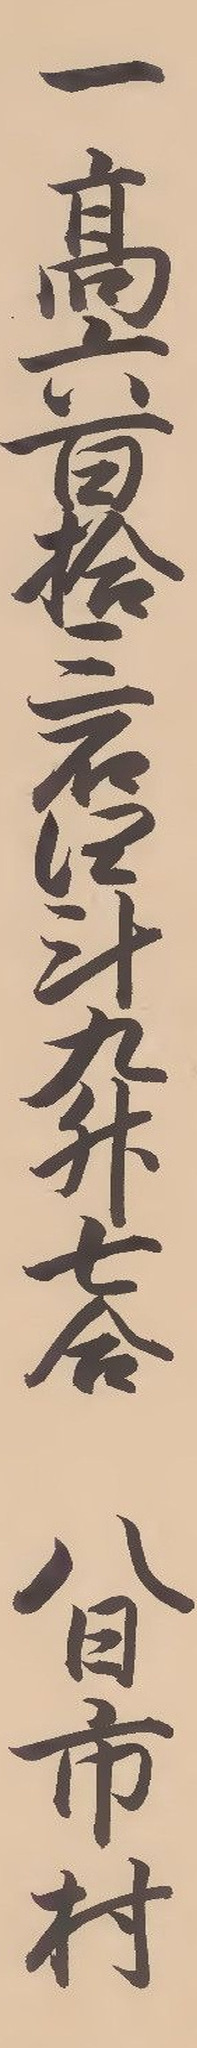一髙六百拾三石四斗九升七合八日市村
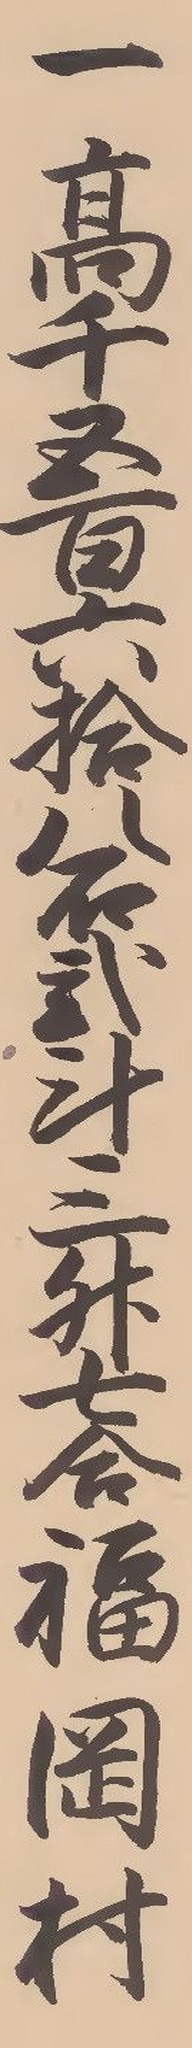一髙千五百六拾八石弐斗三升七合福岡村

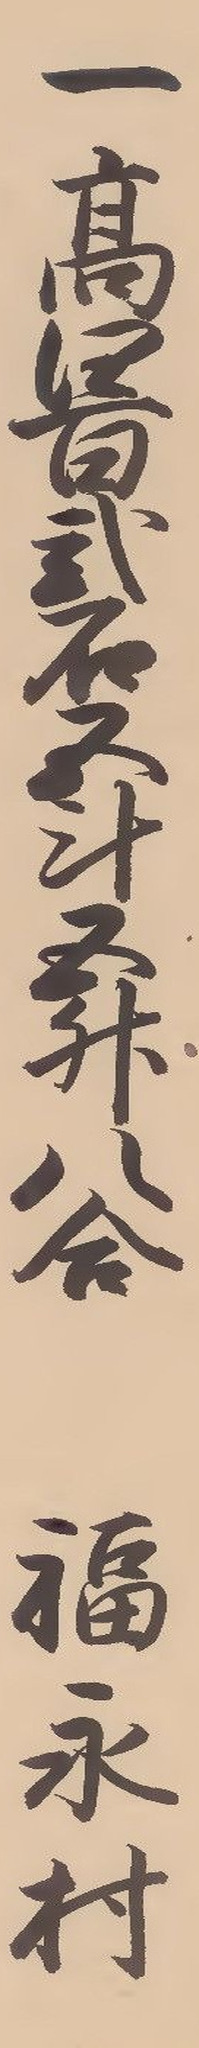一髙四百弐石五斗五升八合福永村
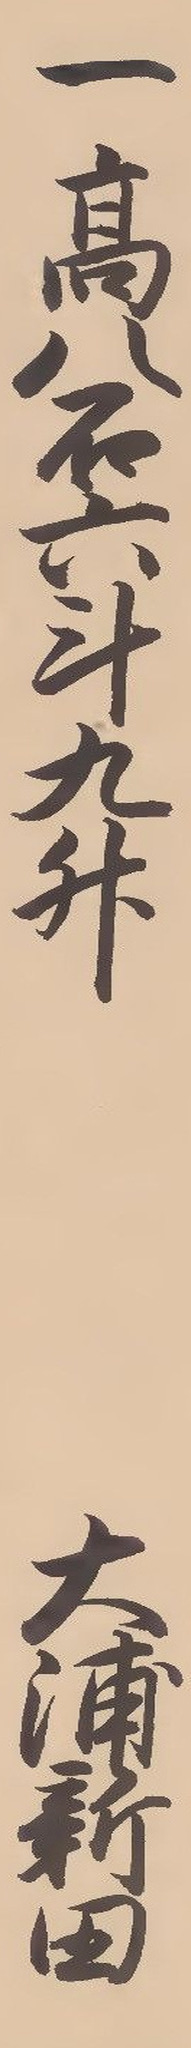一髙八石六斗九升大浦新田
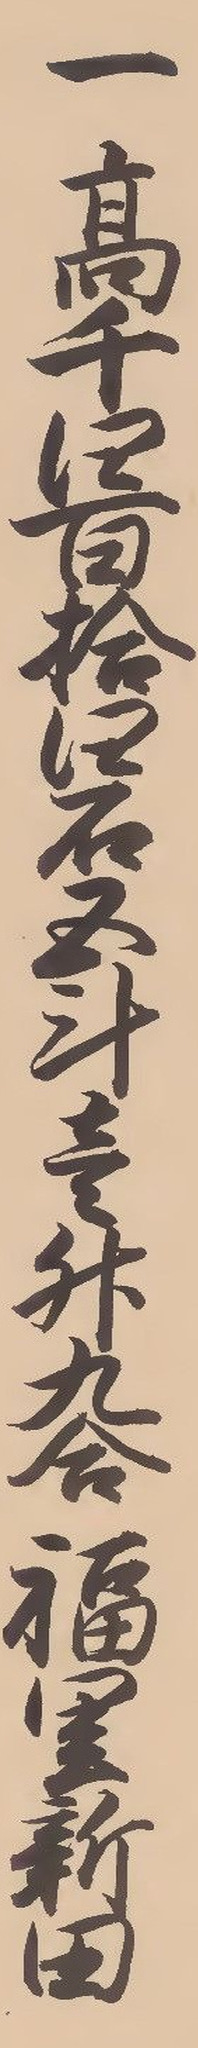一髙千四百拾四石五斗壱升九合福里新田
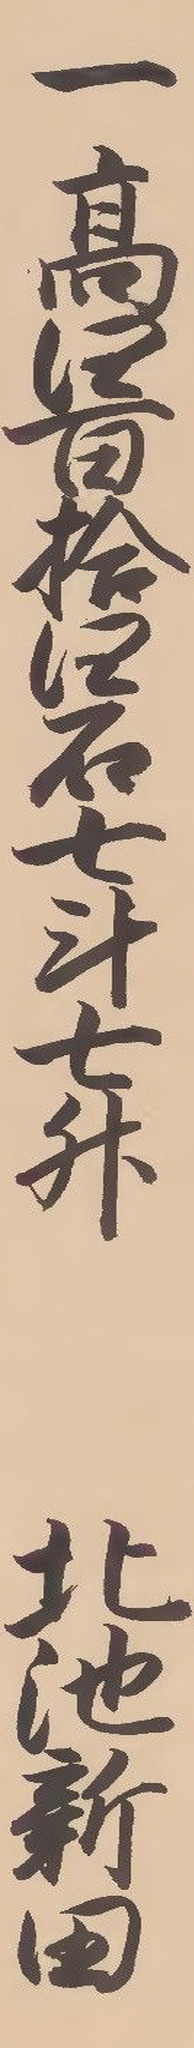一髙四百拾四石七斗七升北池新田
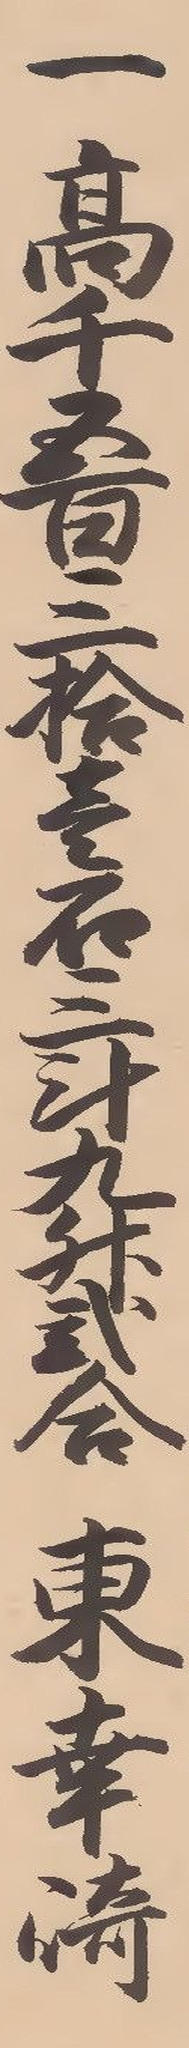一髙千五百三拾壱石三斗九升弐合東幸崎
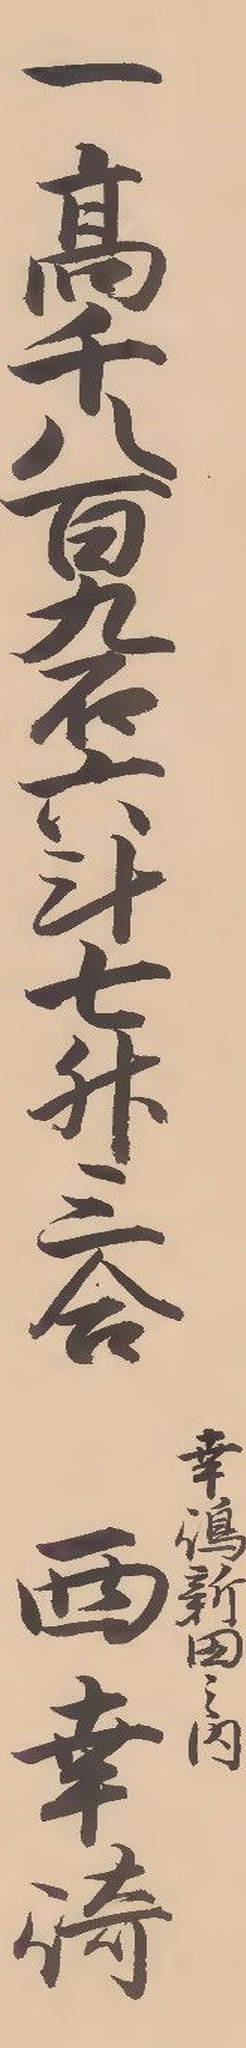一髙千八百九石六斗七升三合西幸崎
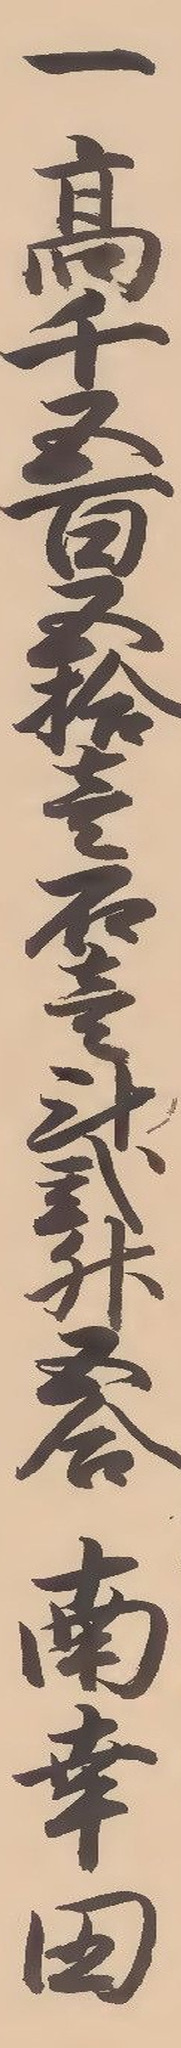一髙千五百五拾壱石壱斗弐升五合南幸田
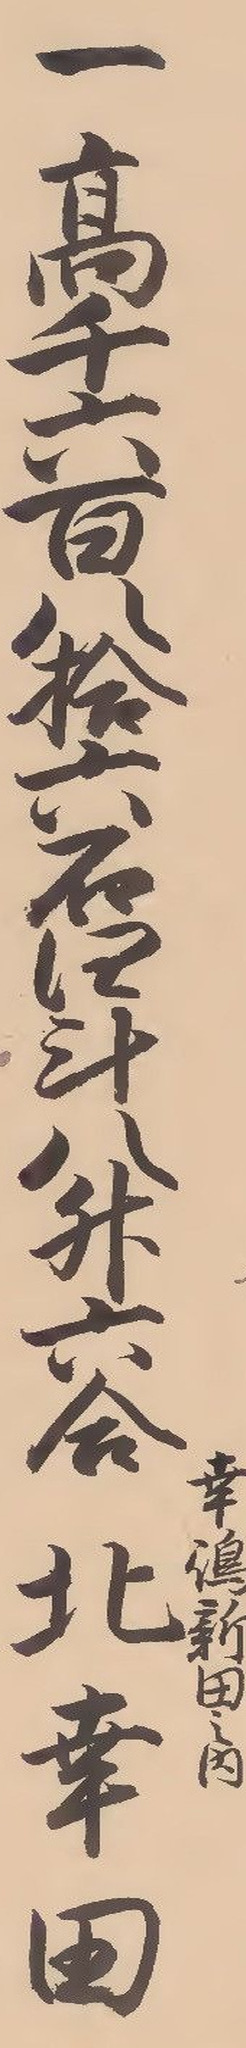一髙千六百八拾六石四斗八升六合北幸田

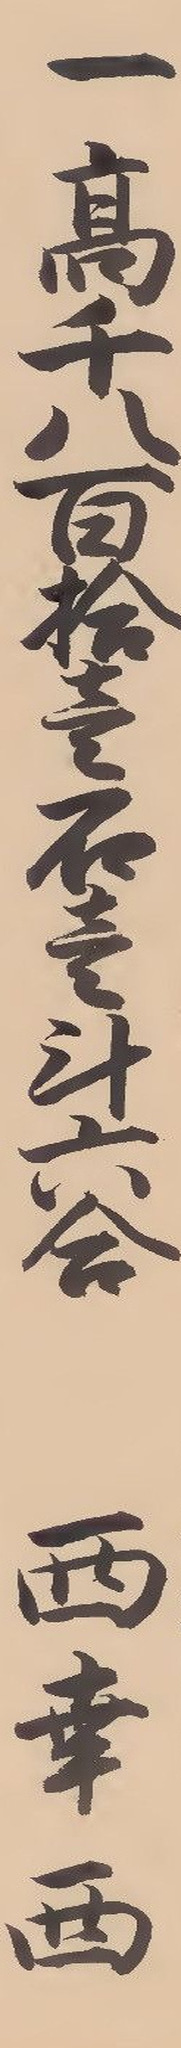一髙千八百拾壱石壱斗六合西幸西
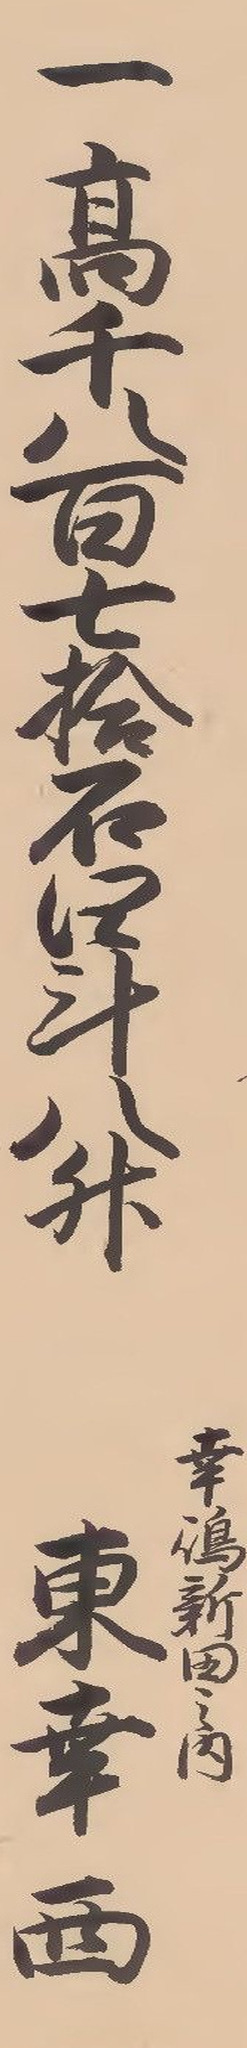一髙千八百七拾石四斗八升東幸西
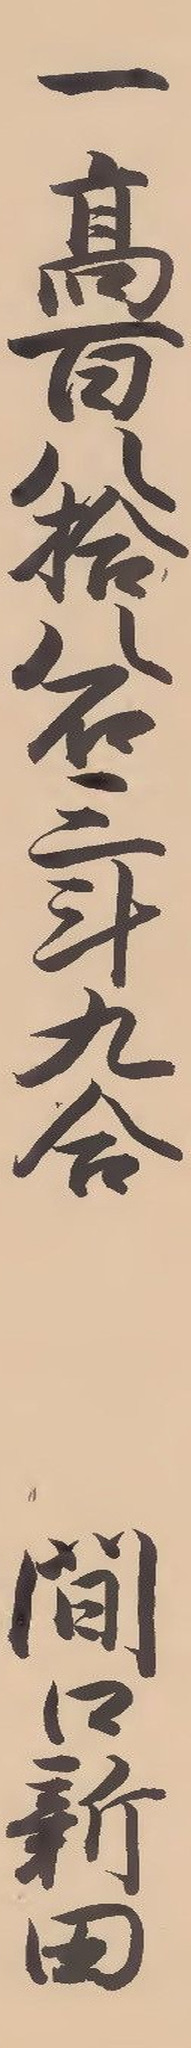一髙百八拾八石三斗九合間口新田
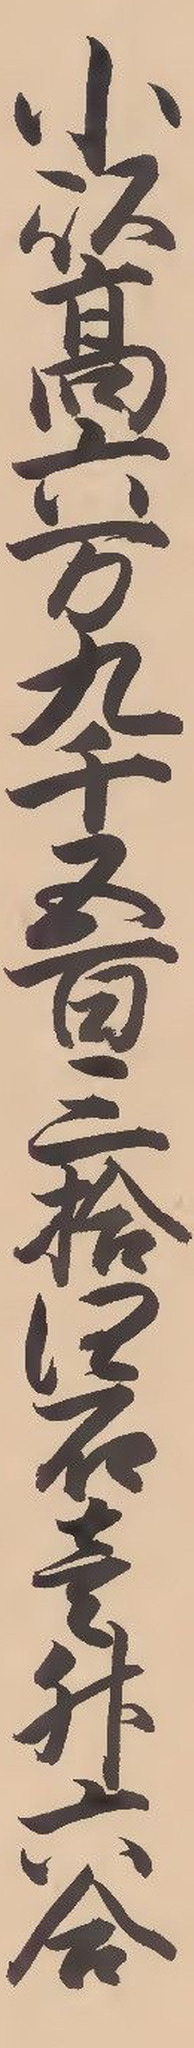小以髙六万九千五百三拾四石壱升六合
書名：備前国郷帳
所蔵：国立公文書館 National Archives of Japan
